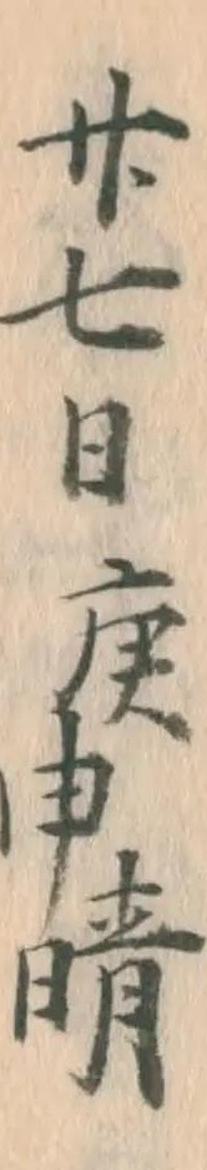廿七日庚申晴
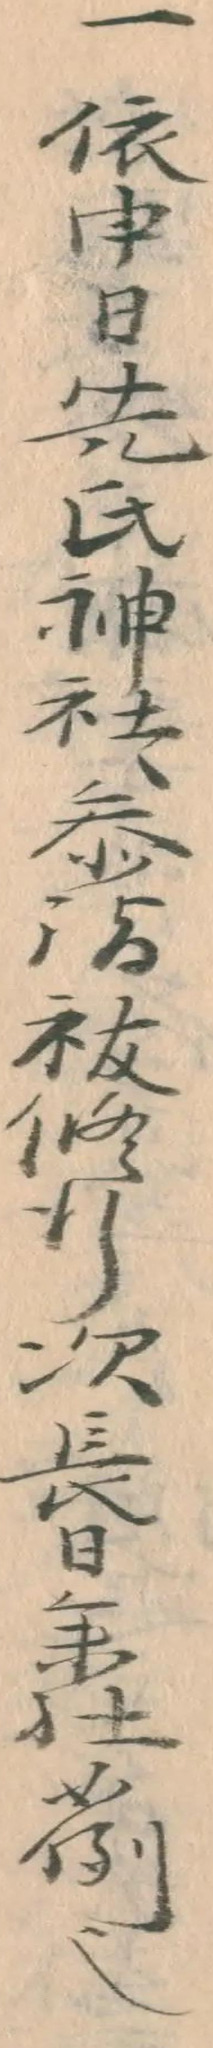一依申日先氏神社へ参詣祓修行次長日参社如例也
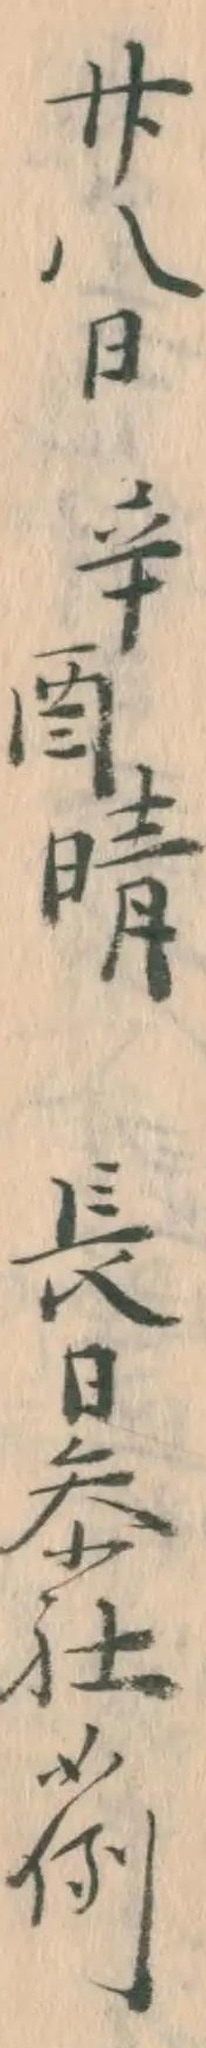廿八日辛酉晴長日参社如例
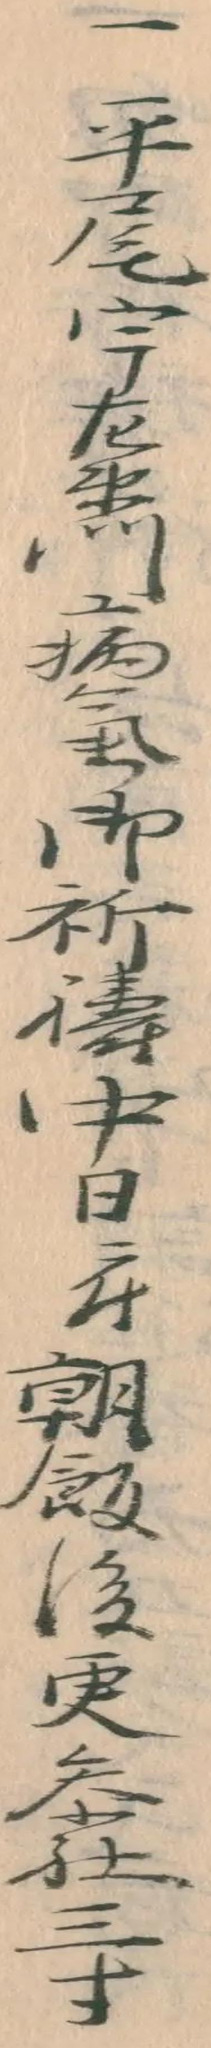一平尾宇左衛門病氣御祈祷中日ニ付朝飯後更参社三寸
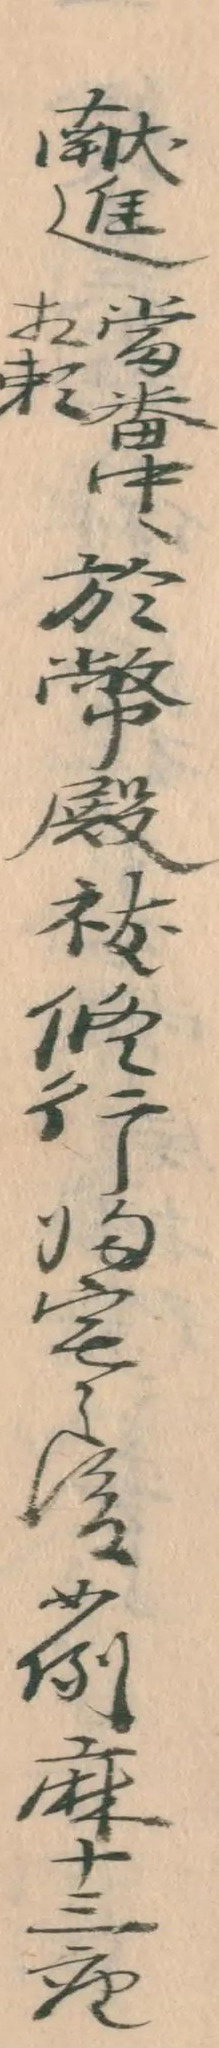献進當番中へ相頼於幣殿祓修行帰宅之後如例麻十三座
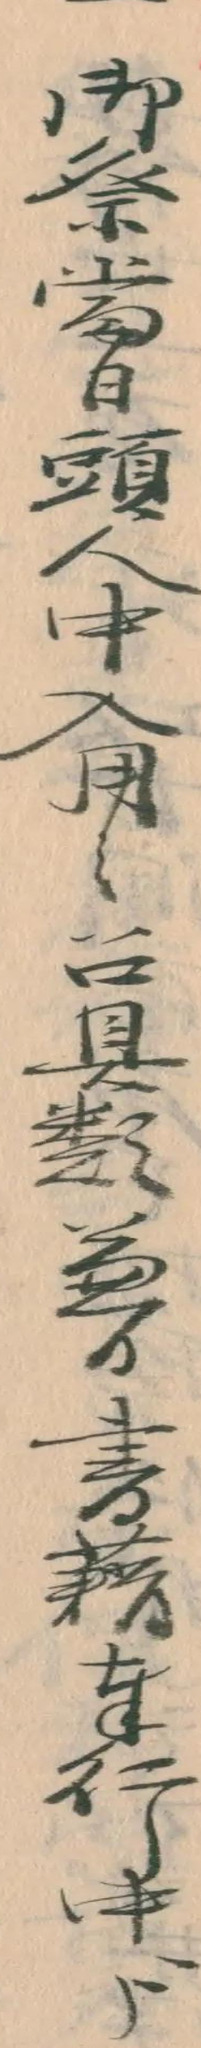一御祭當日頭人中入用之召具類兼日書籍奉行中へ申
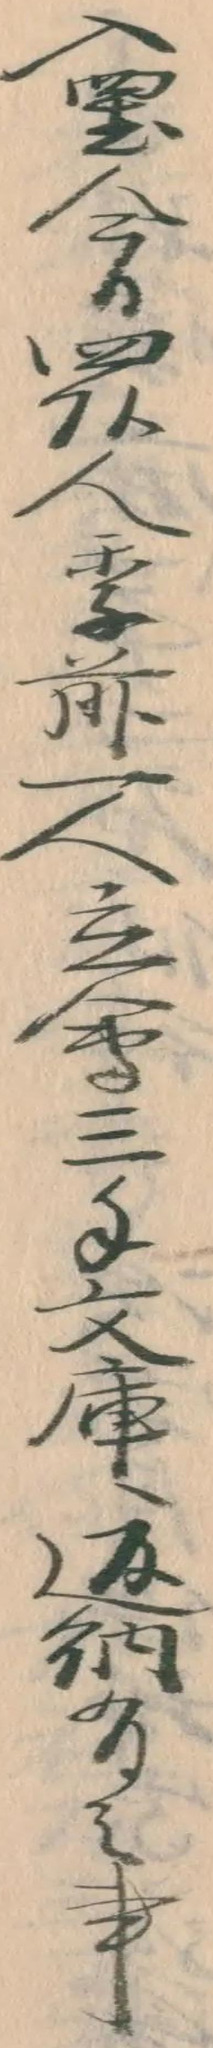入置今日頭人季前一人立會三手文庫へ返納有之事
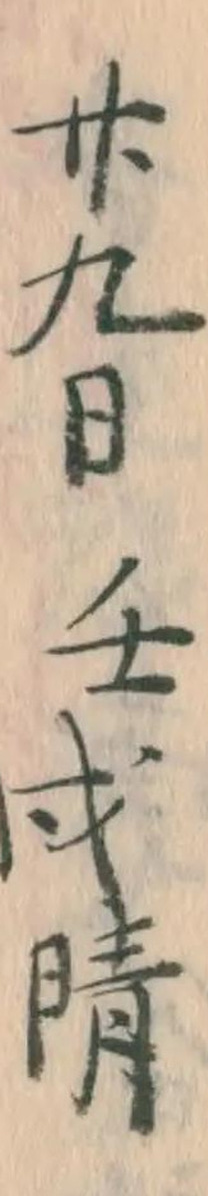廿九日壬戌晴
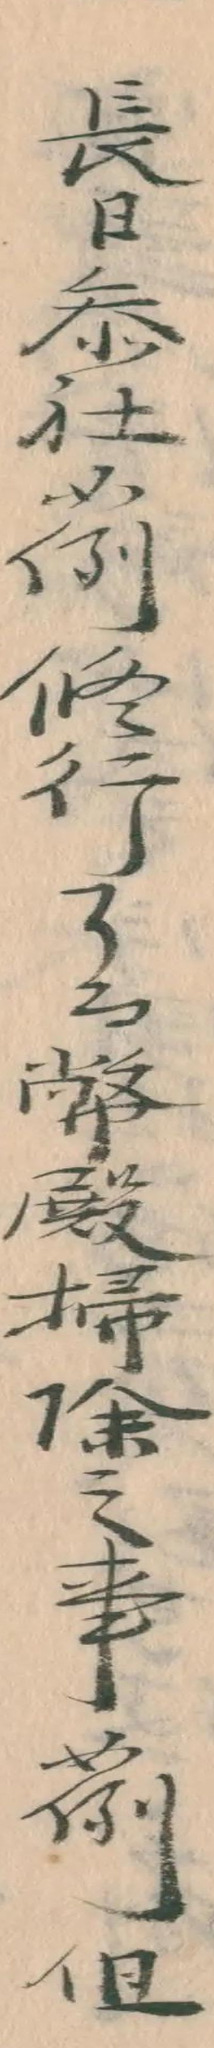一長日参社如例修行了而幣殿掃除之事如例但
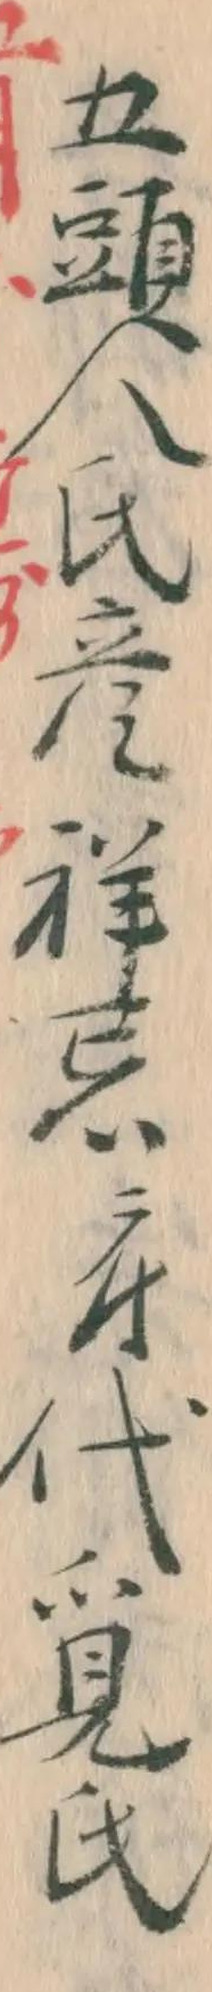五頭人氏彦祥忌ニ付代覓氏
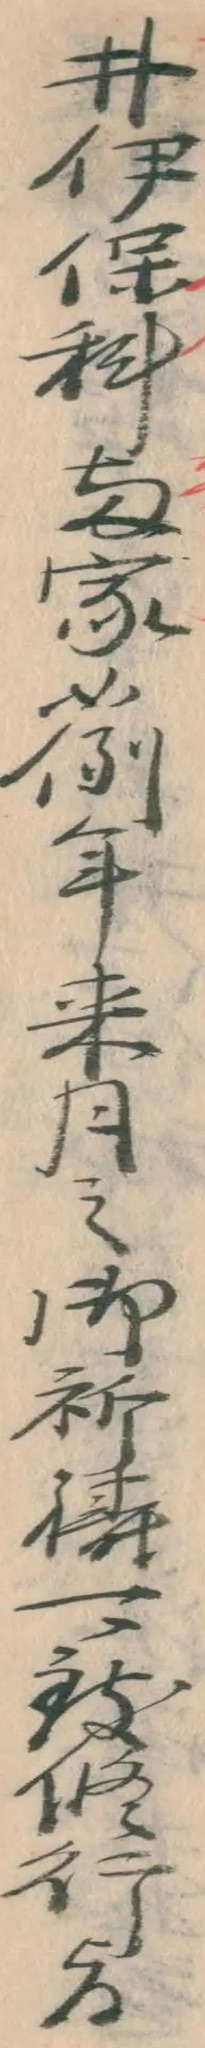一井伊保科両家如例年来月之御祈祷可致修行旨
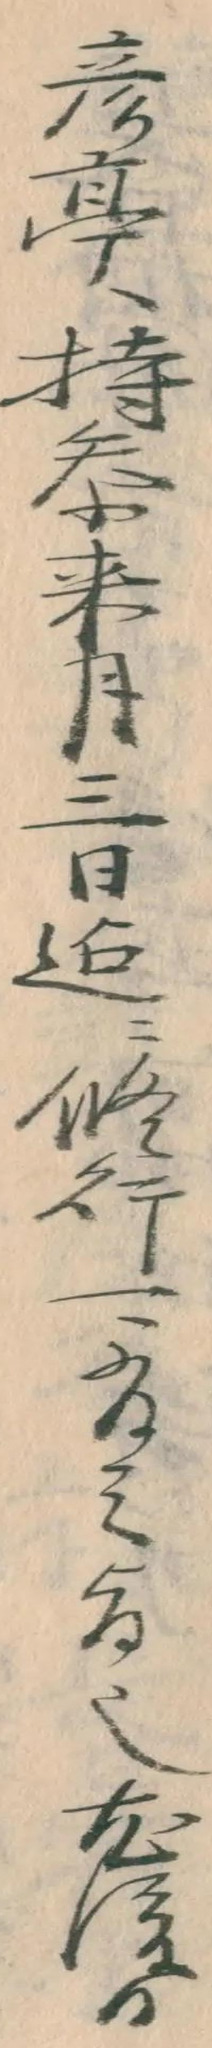彦亭へ持参来月三日迄ニ修行可有之旨也尤後日
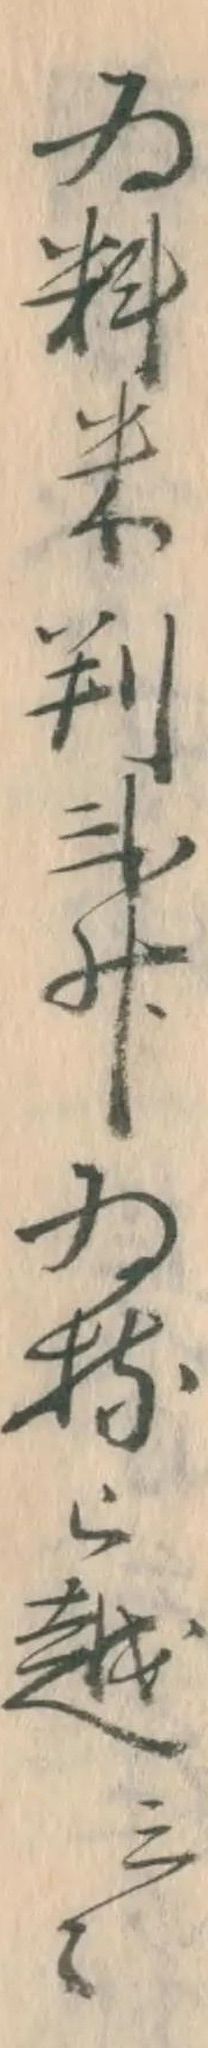為料米判弐升為持被越云々

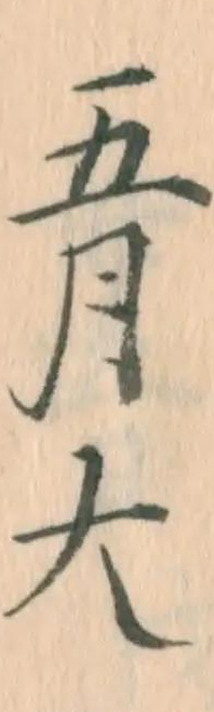五月大
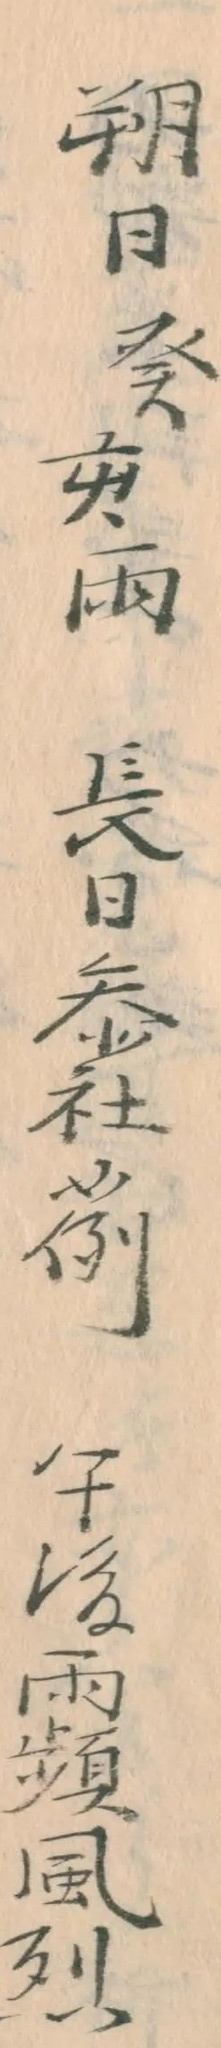朔日癸亥雨長日参社如例午後雨頻風烈
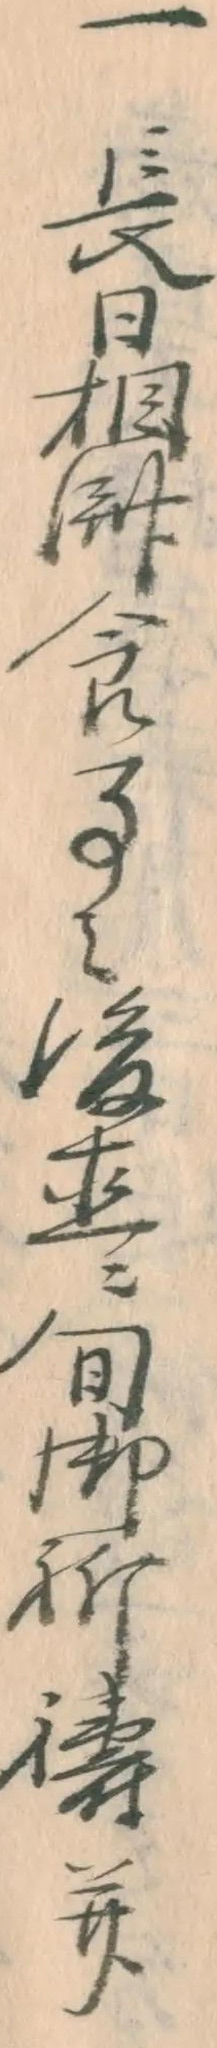一長日相済食事之後直ニ旬御祈祷幷
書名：賀茂社記録. 第73冊
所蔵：国立国会図書館 National Diet Library, JAPAN
